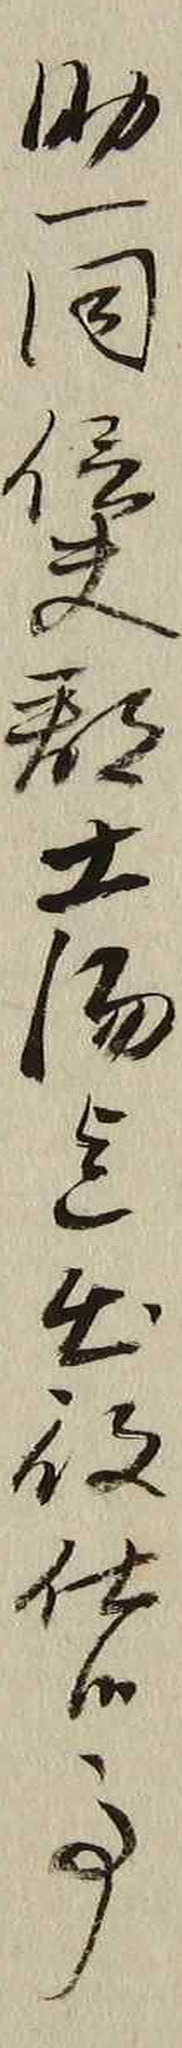助一同信夫郡土湯迄出役仕候事
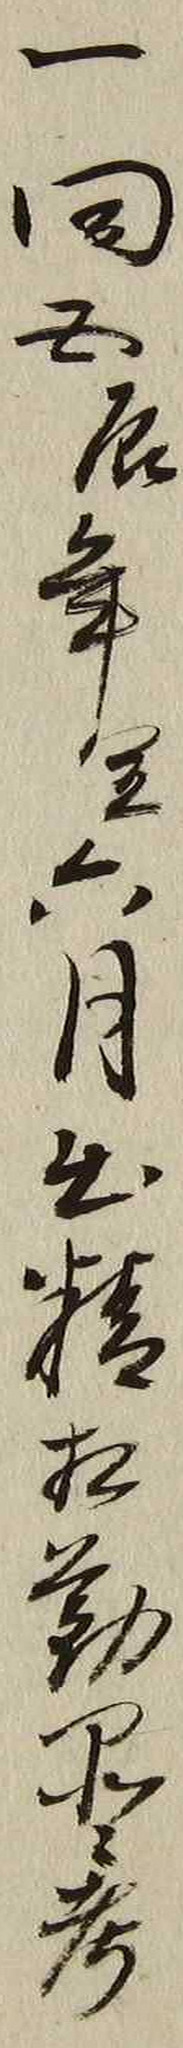一同五辰年閏六月出精相勤品々考
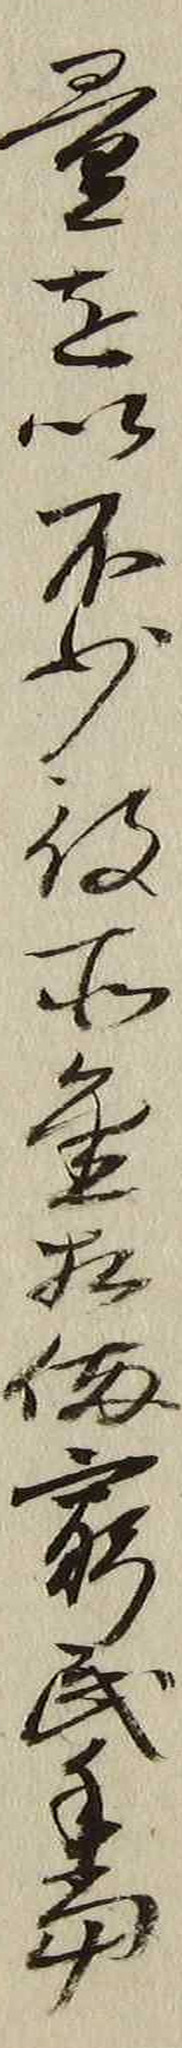量を以不少役所金相備窮民手当
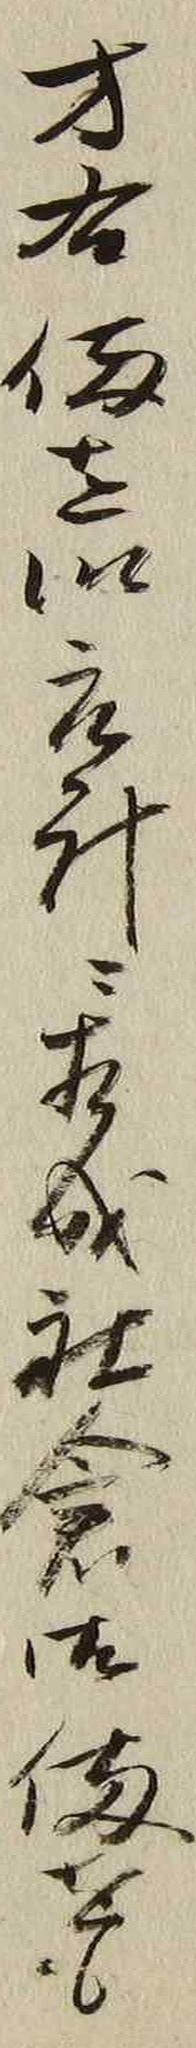方右備を以取計ニ相成社倉御備をも
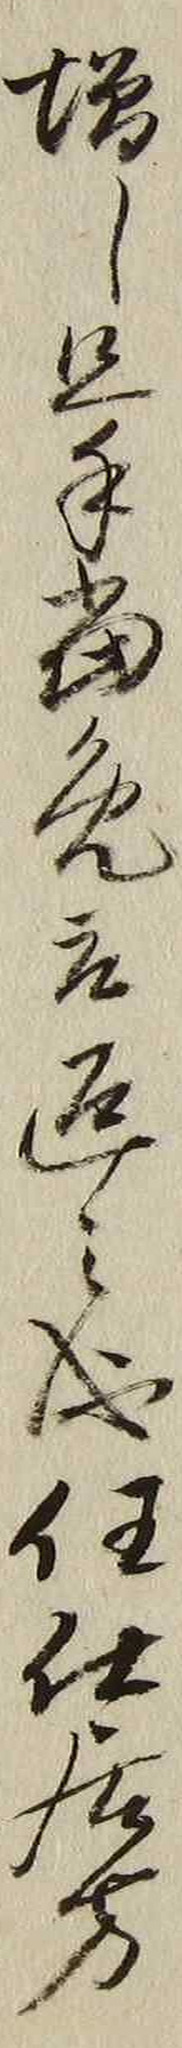増し且手当免取返之儀任仕居方
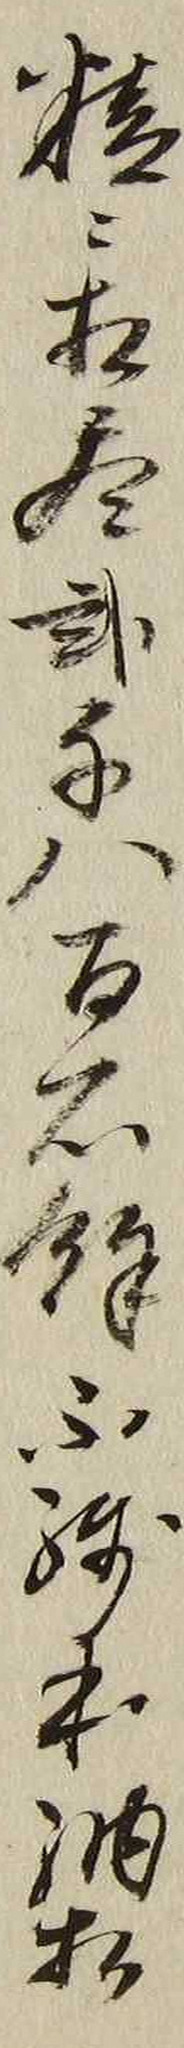精々相尽弐千八百石余不残本納相
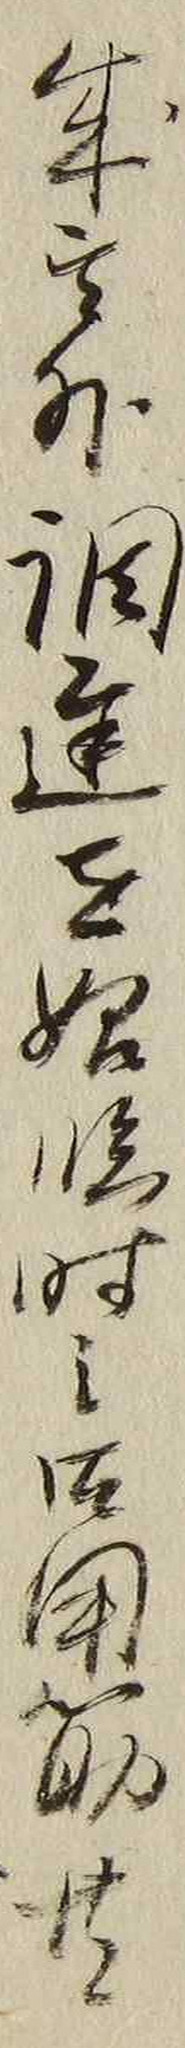成其外調達を始臨時之御用筋共
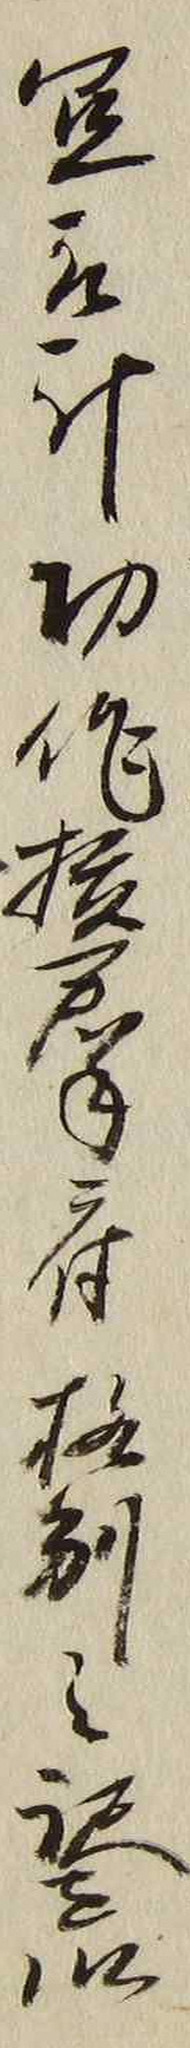宜取計功作抜群ニ付格別之訳を以
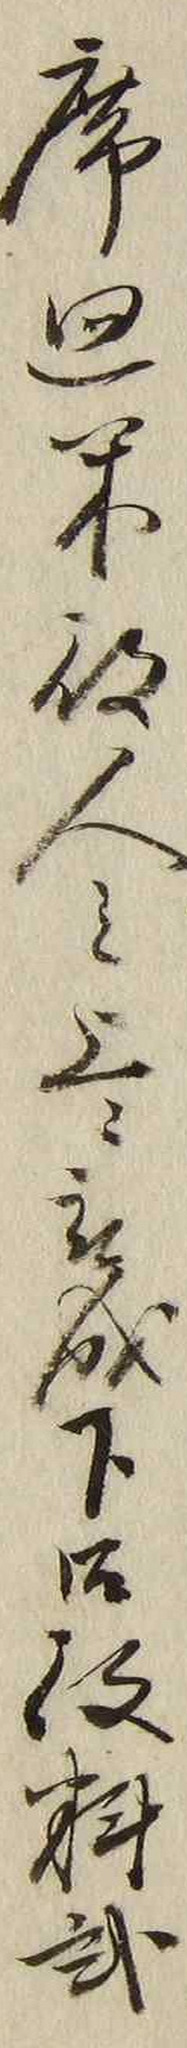席廻米役人之上ニ被成下御役料弐

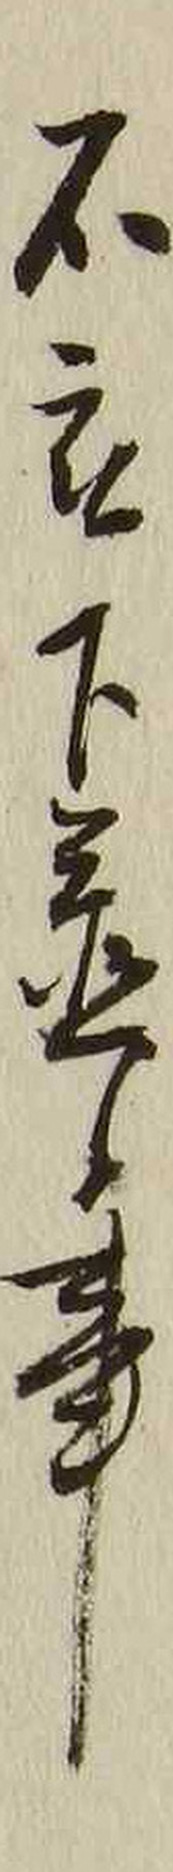石被下置候事
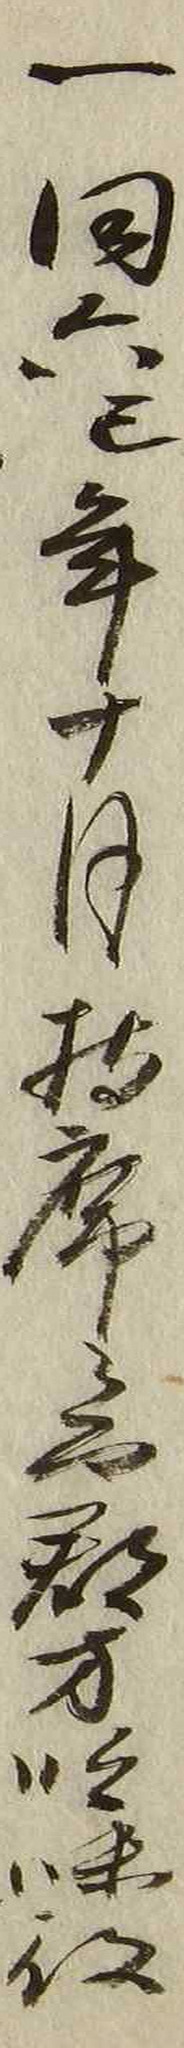一同六巳年十月持席ニ而郡方吟味役
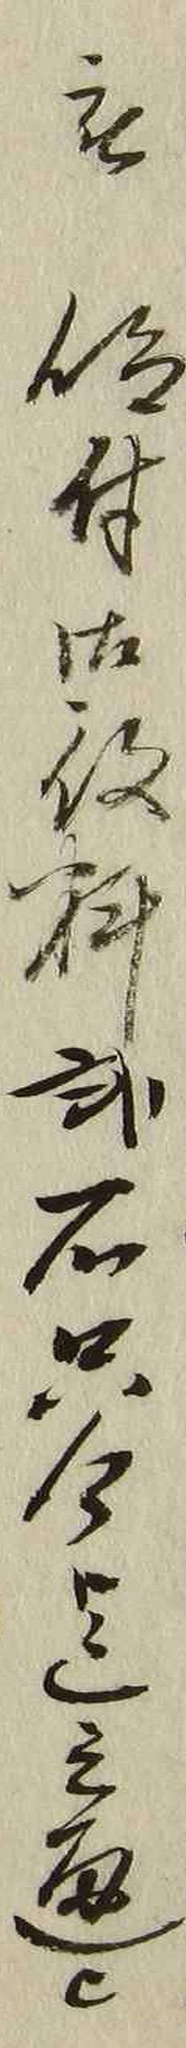被仰付御役料弐石只今迄之通被
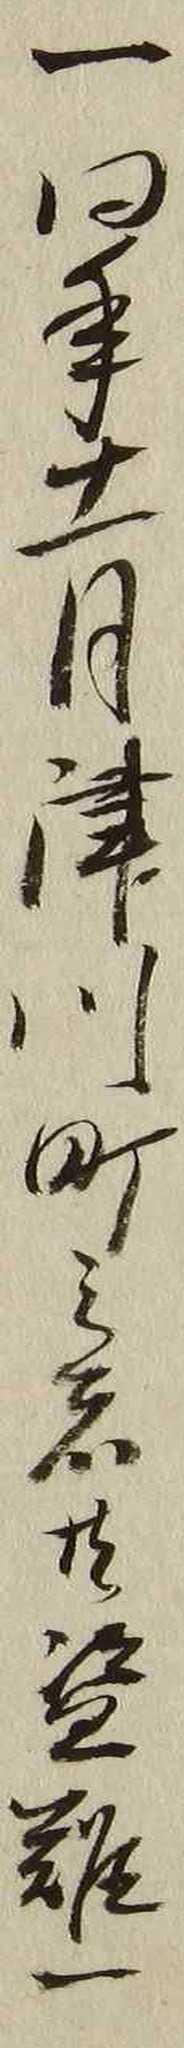一同年十一月津川町之者共盗難一
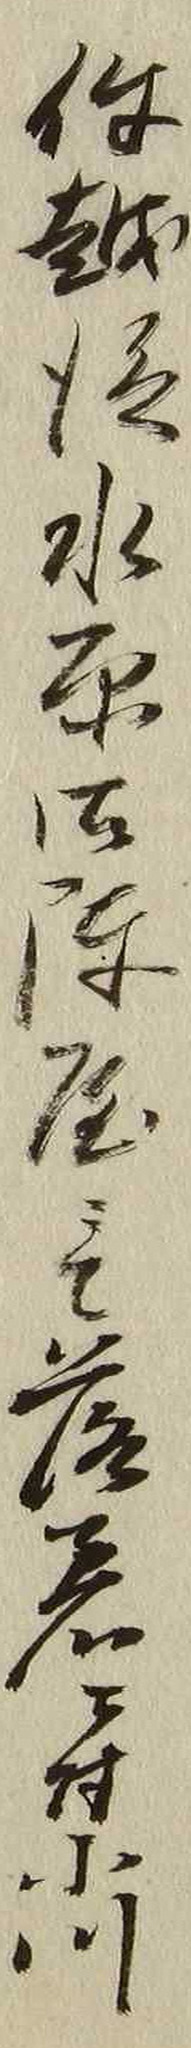件越後水原御陣屋ニて落着ニ付小川
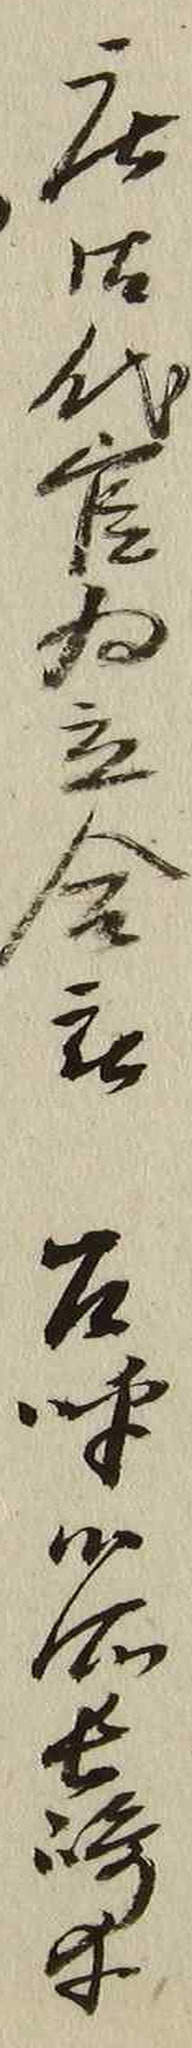庄御代官為立合被召呼候所長崎幸
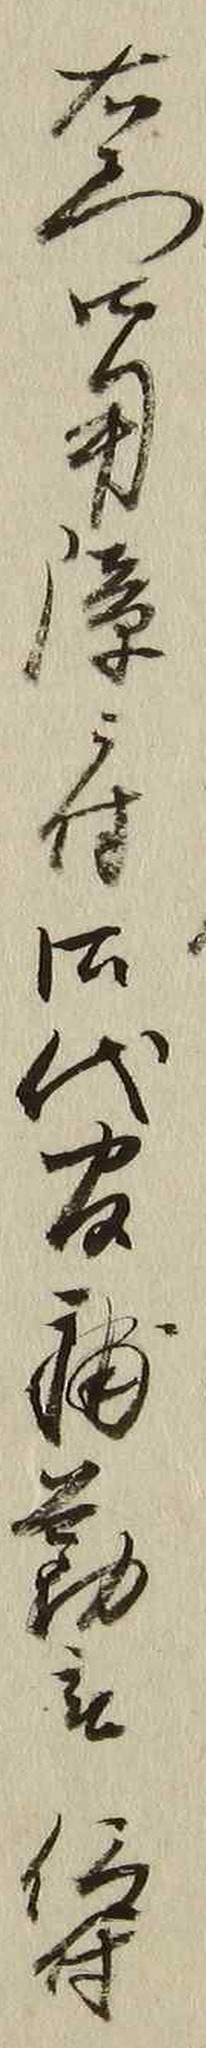右衛門御用障ニ付御代官補勤被仰付
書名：諸士系譜　巻之352　す之部2
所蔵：会津若松市立会津図書館
